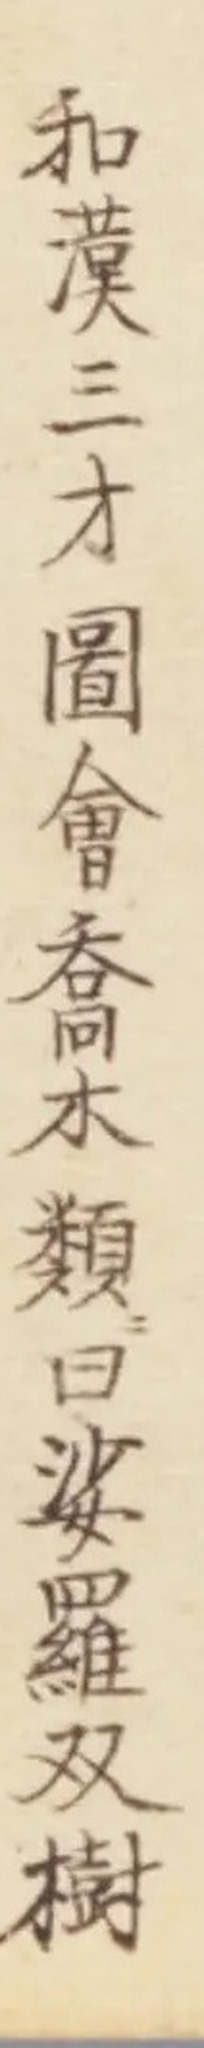和漢三才圖會喬木類に曰娑羅双樹
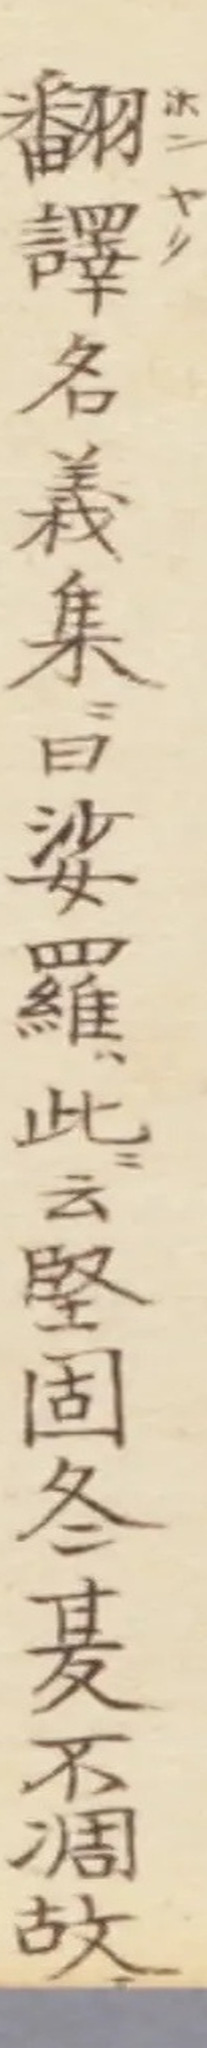翻譯名義集に曰娑羅は此に云堅固冬夏不凋故
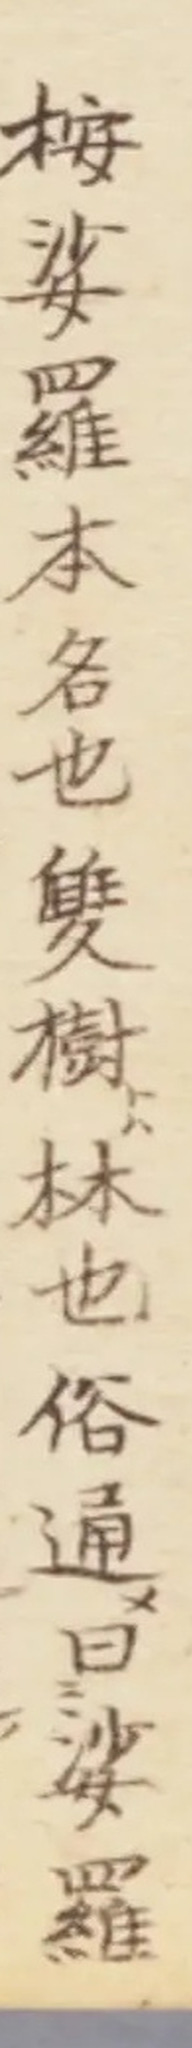按娑羅本名也雙樹とは林也俗通め曰娑羅
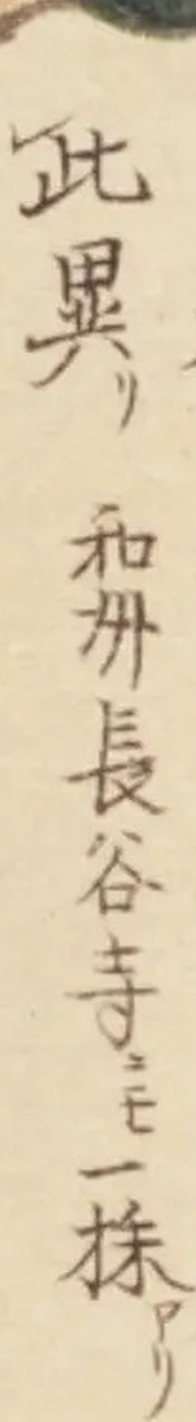此れ異り和長谷寺にも一株あり
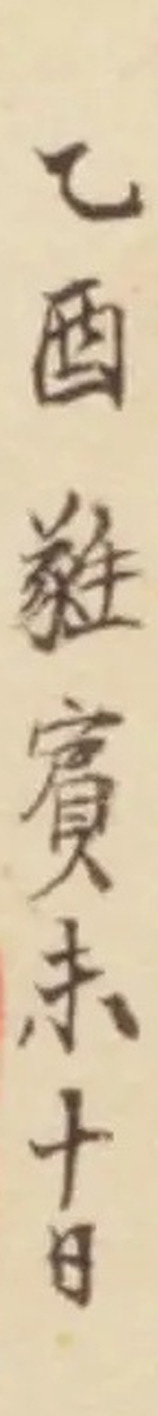乙酉蕤賓末十日
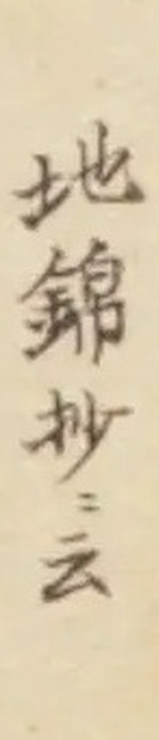地錦抄に云
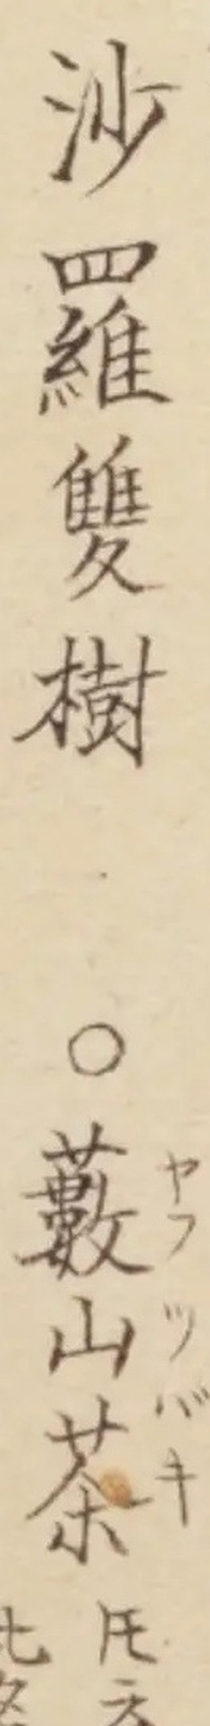沙羅雙樹〇藪山茶共云
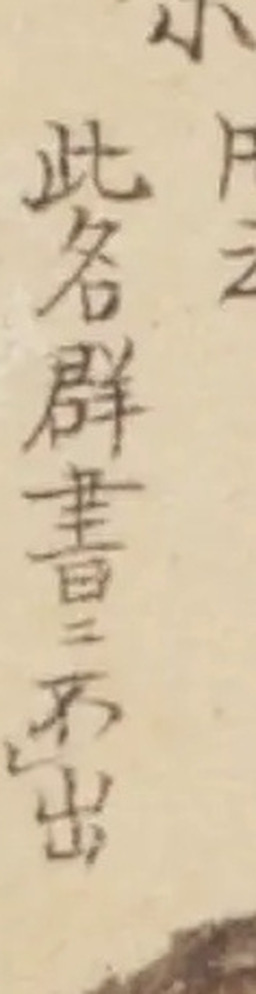此名群書に不出
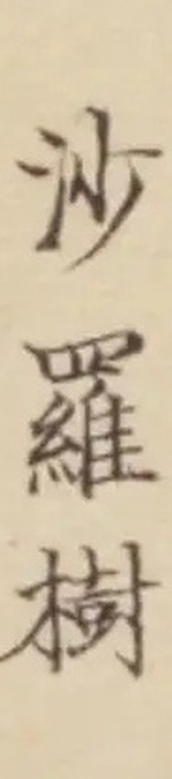沙羅樹

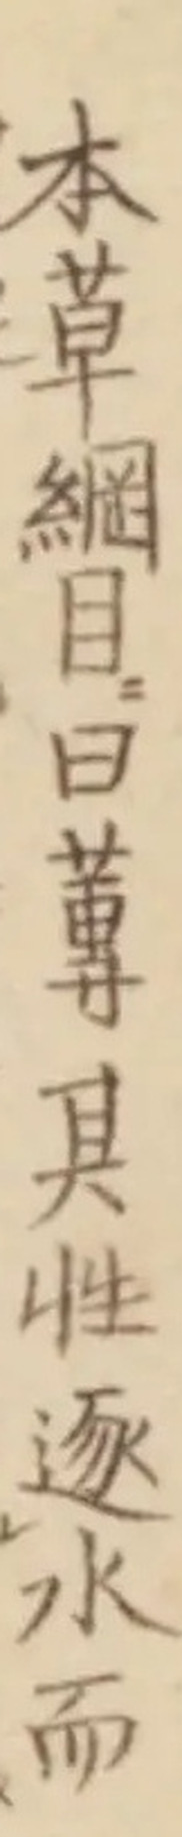本草綱目に曰蒪其性逐水学而
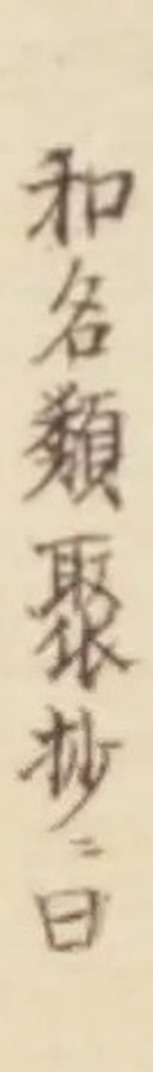和名類聚抄に曰
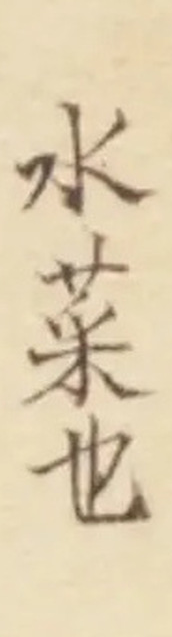水菜也
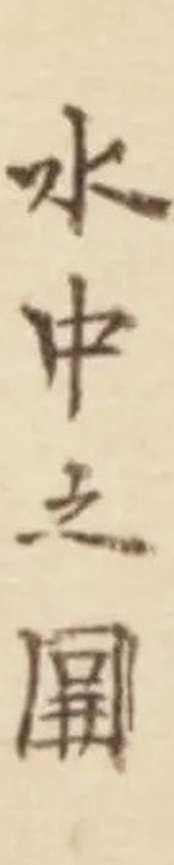水中之圖
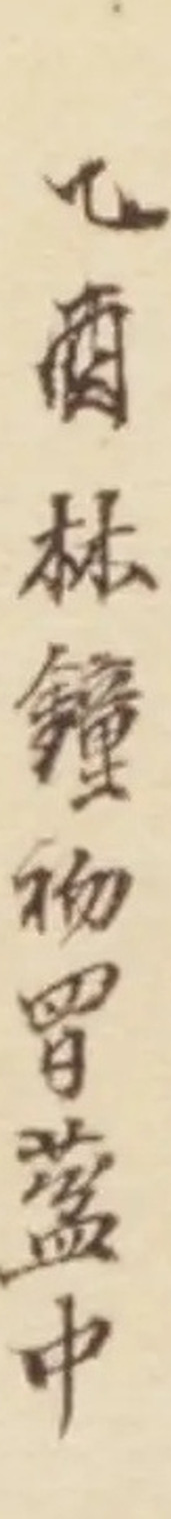乙酉林鐘初四日中
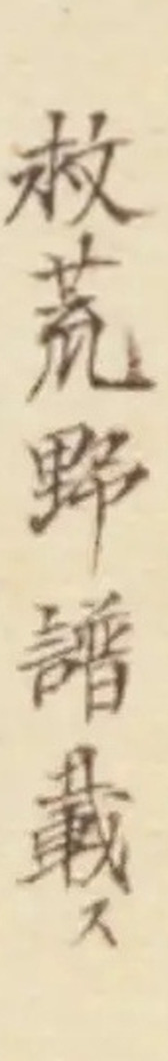救荒野譜載す
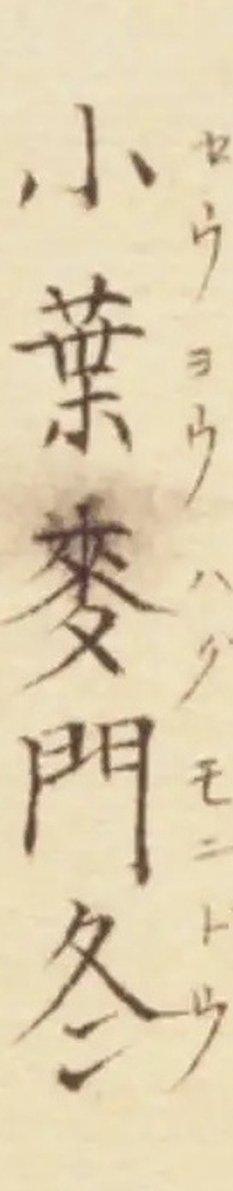小葉麥門冬
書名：梅園草木花譜夏之部. 3
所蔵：国立国会図書館 National Diet Library, JAPAN
